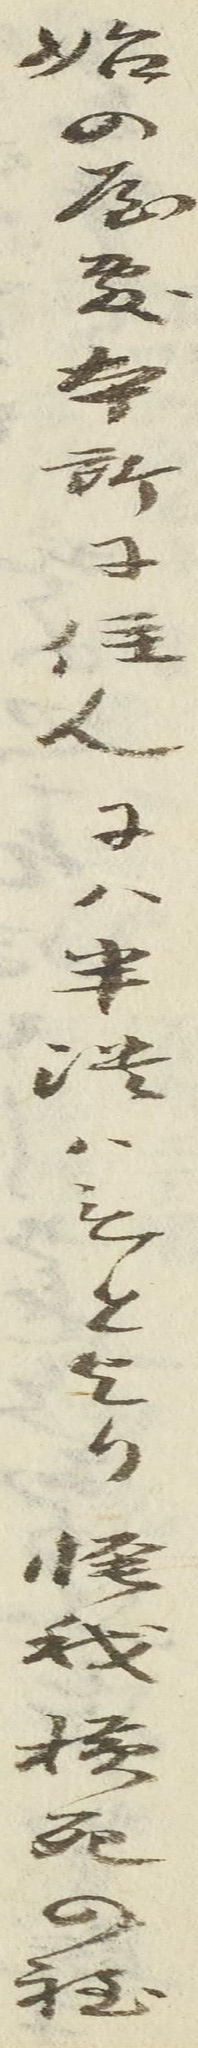始の屋敷本所に住んにハ半潰ハもとより怪我横死の程
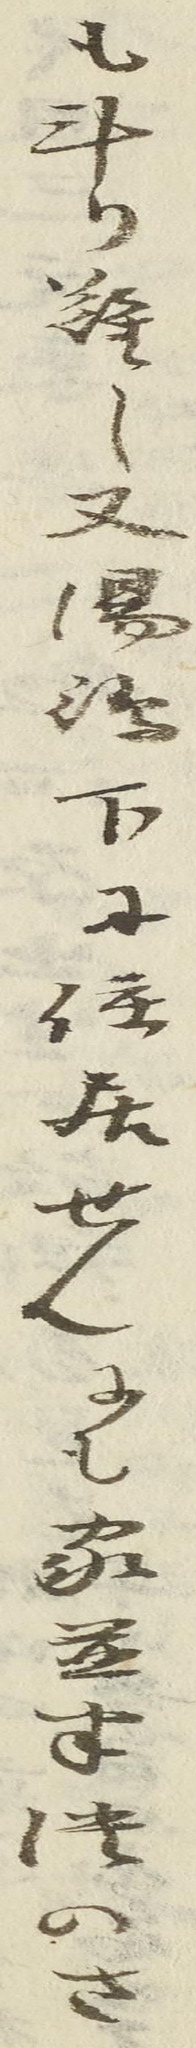も斗り難し又湯嶋下に住居せんにも家並半潰のさ
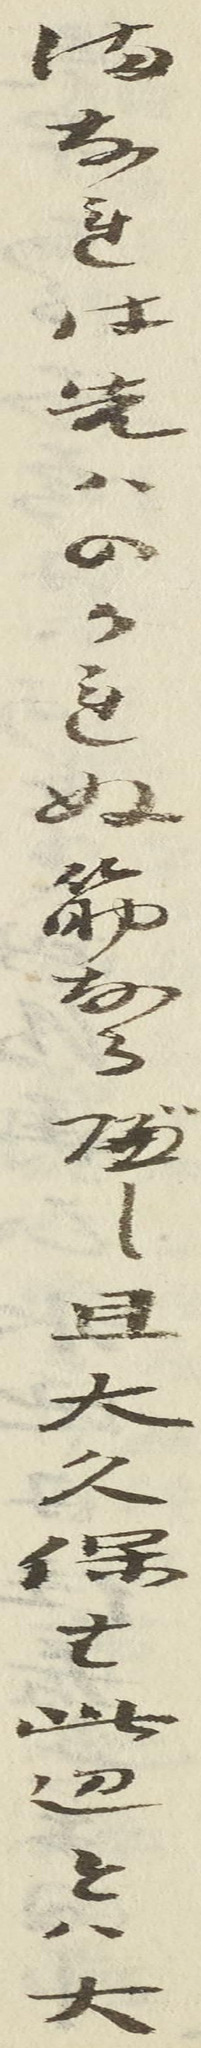まならは先ハのかれぬ筋なるべし且大久保は此辺とハ大
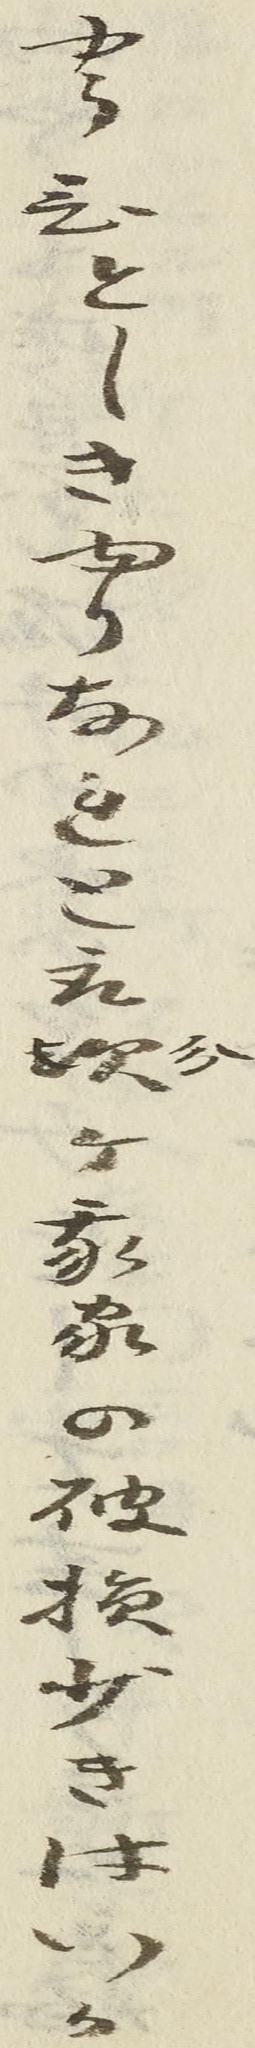ゆりひとしきゆりなれと取分ヶ我家の破損少きはいか
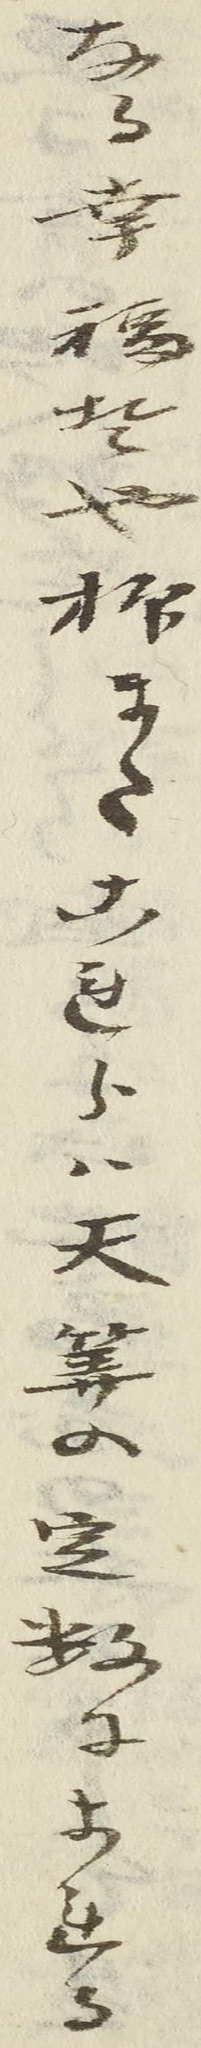なる幸福そや抑またこれらハ天算の定数によれる
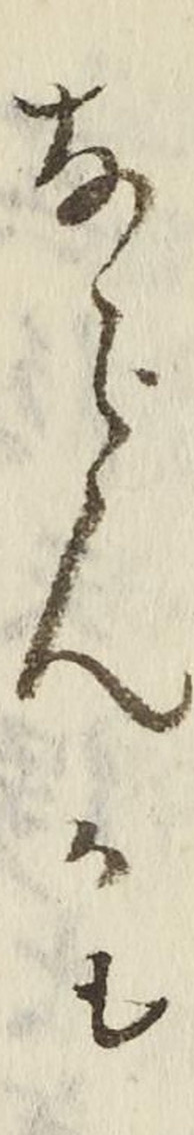ならんかも
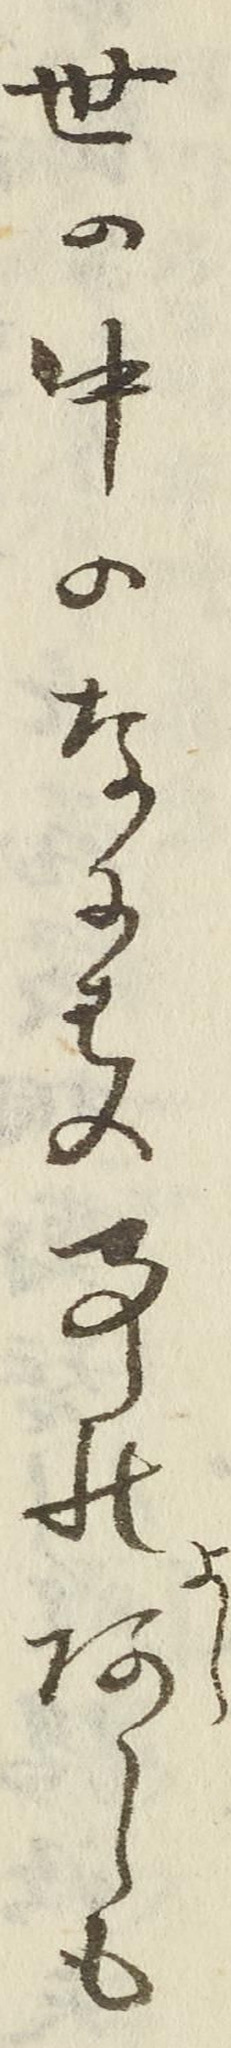世の中のなにはの事のよしあしも
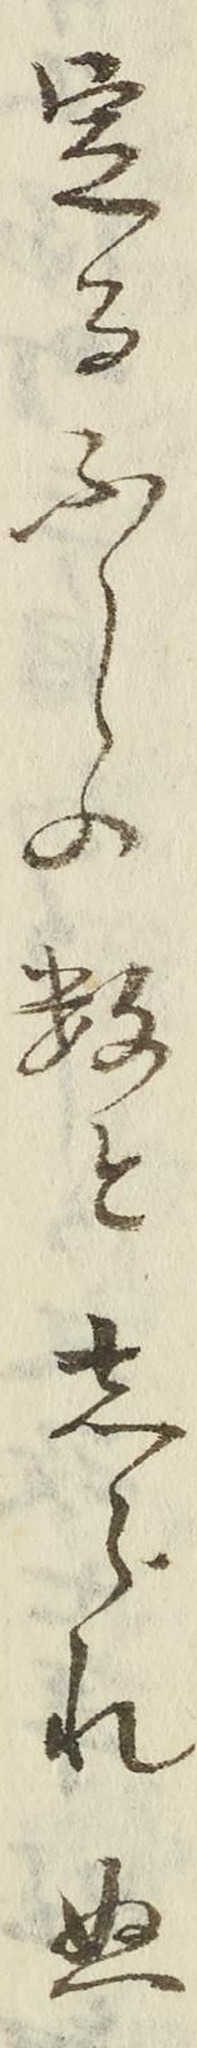定るふしの数としられぬ
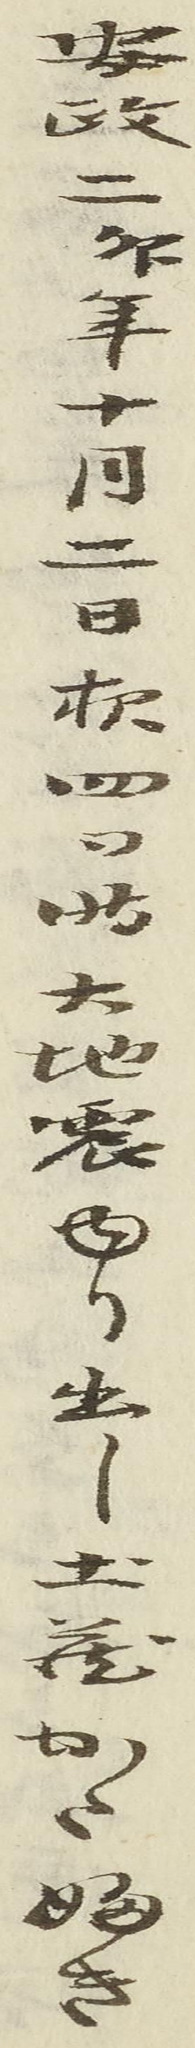安政二卯年十月二日夜四ッ時大地震ゆり出し土蔵かたふき
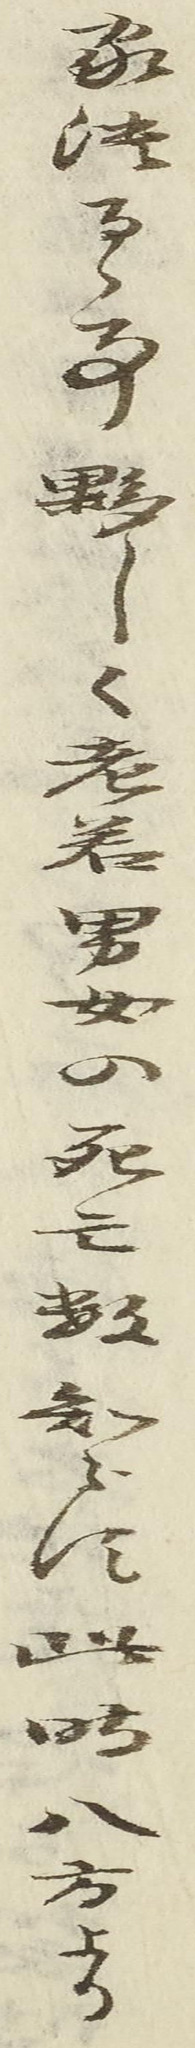家潰るゝ事夥しく老若男女の死亡数知らす此時八方より
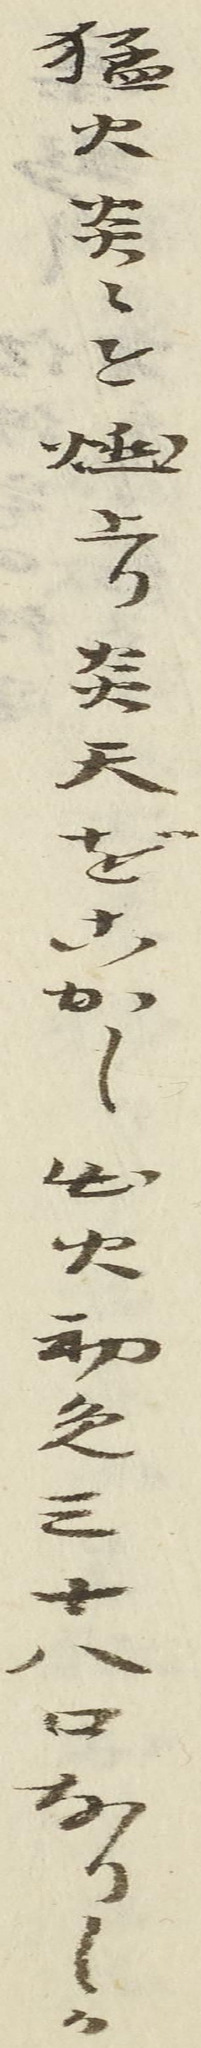猛火炎々と燃上り炎天をこかし出火初め三十八口なりしか
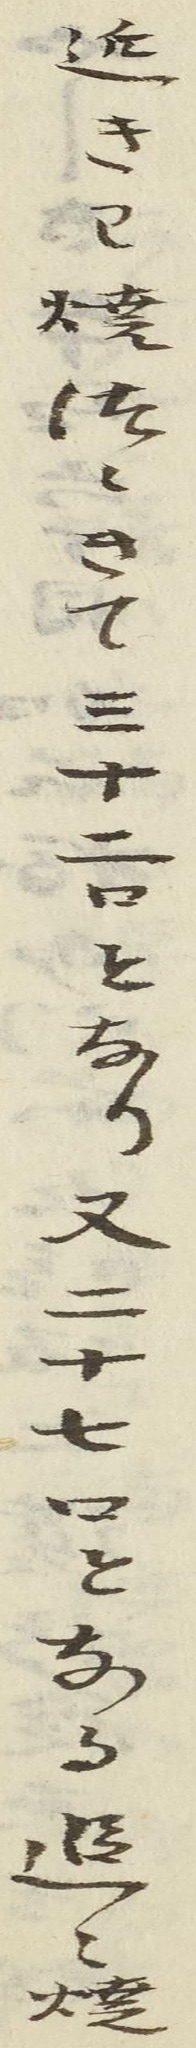近きわ焼つゝきて三十二口となり又二十七口となる追々焼
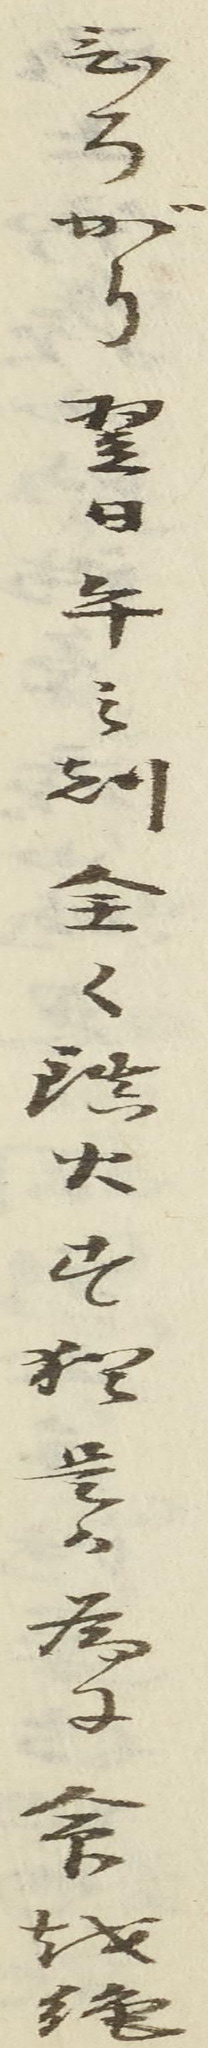ひろかり翌日午之刻全く鎮火す猶是か為に命を絶
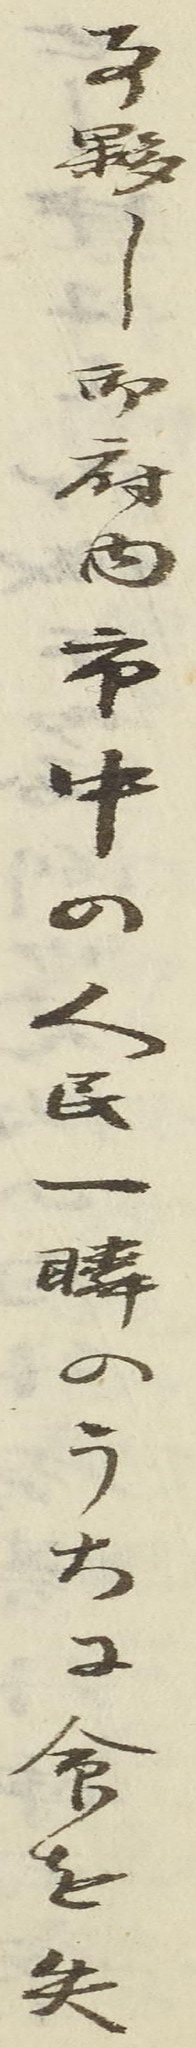事夥し御府内市中の人民一瞬のうちに命を失
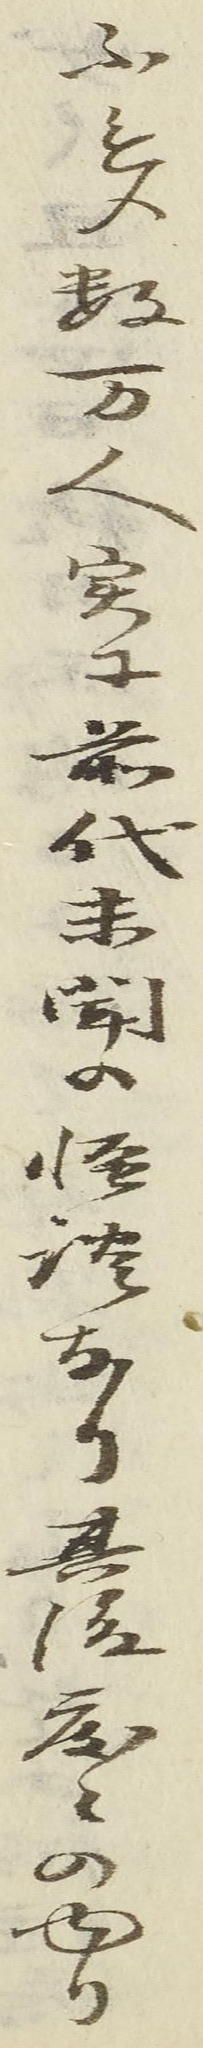ふもの数万人実に前代未聞の怪談なり其後度々のゆり
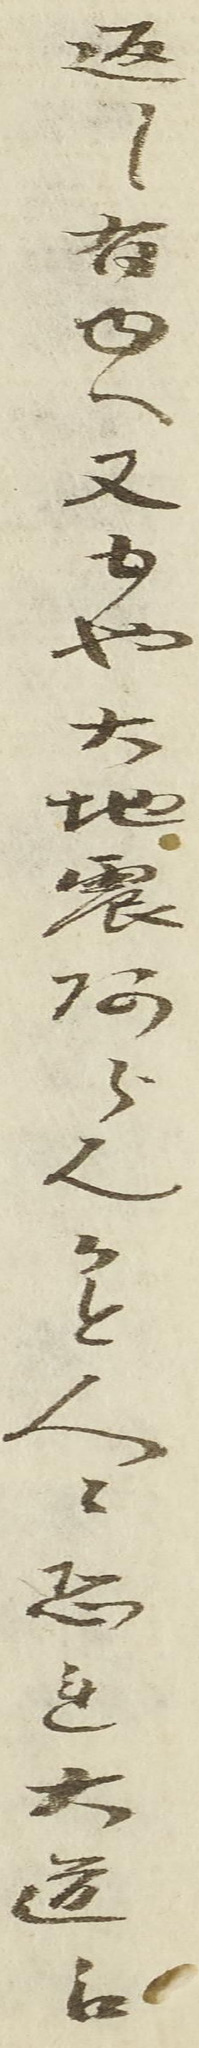返し有ゆへ又もや大地震ならんかと人々恐れ大道江
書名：那為の後見艸　全
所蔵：東京大学地震研究所図書室 Earthquake Research Institute Library, The University of Tokyo, JAPAN
